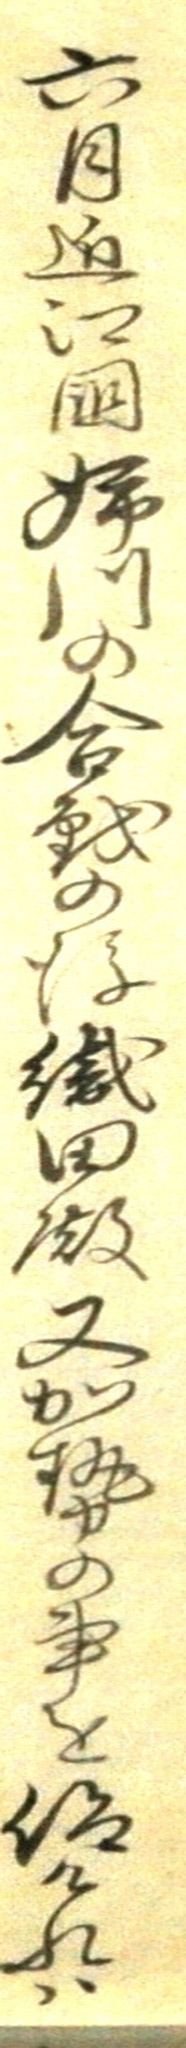六月近江国姉川の合戦の後織田殿又加勢の事を仰けれは
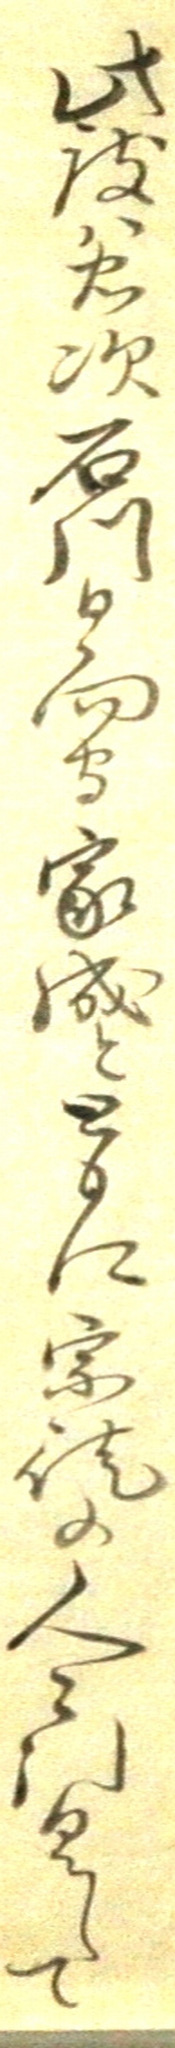此度は忠次石川日向守家成とともに宗徒の人々引具して
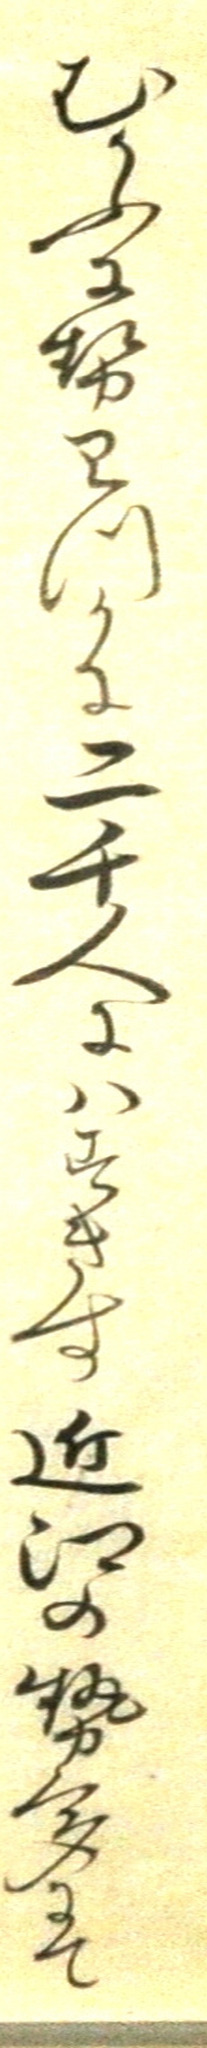むかふに勢わつかに二千人にはすきす近江の勢多にて
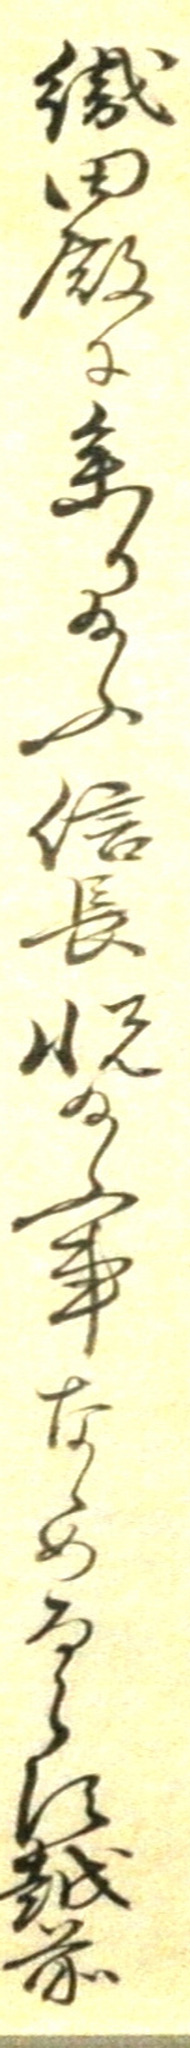織田殿に参り給ふ信長悦給ふ事なゝめならす越前
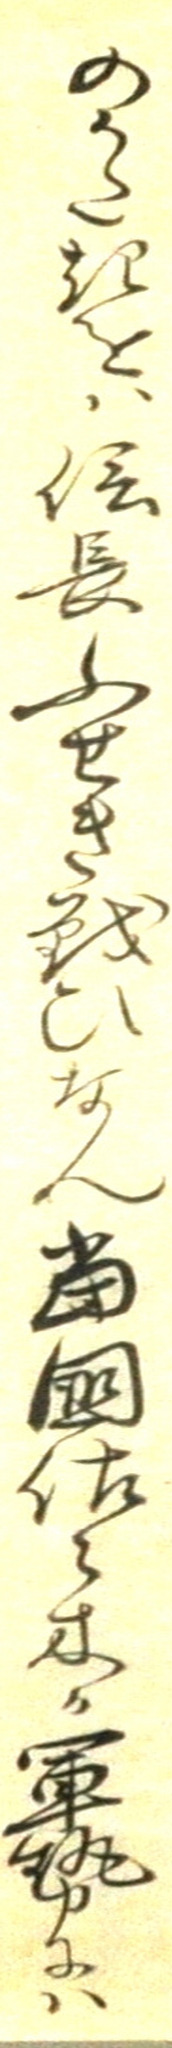のかたきをは信長ふせき戦ひなん当国佐々木か軍勢には
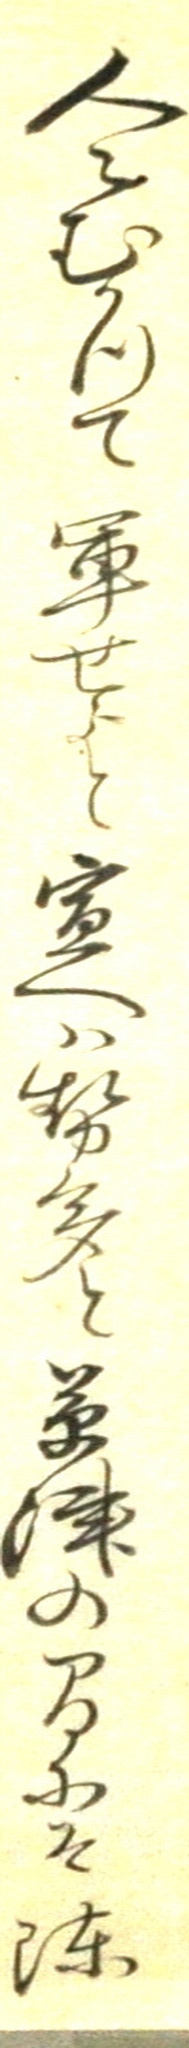人々むかつて軍せよと宣へは勢多と草津の間にそ陣
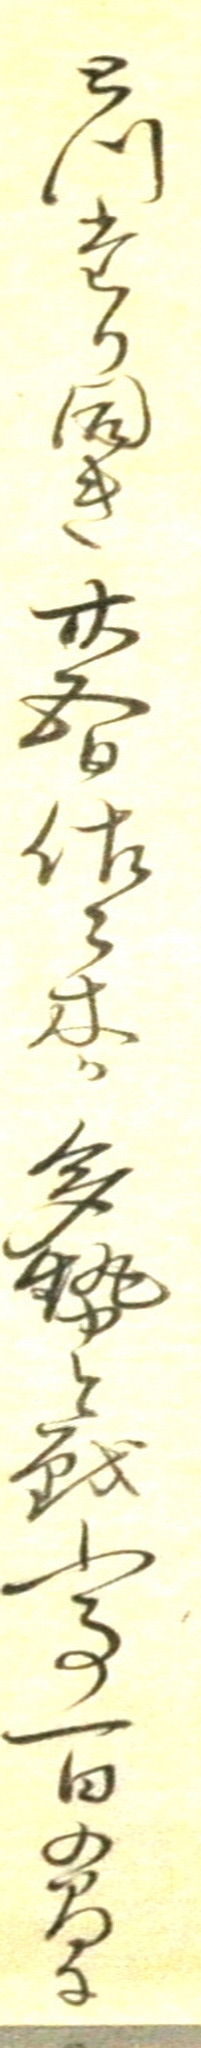とつたり同き廿五日佐々木か多勢と戦ふ事一日の間に
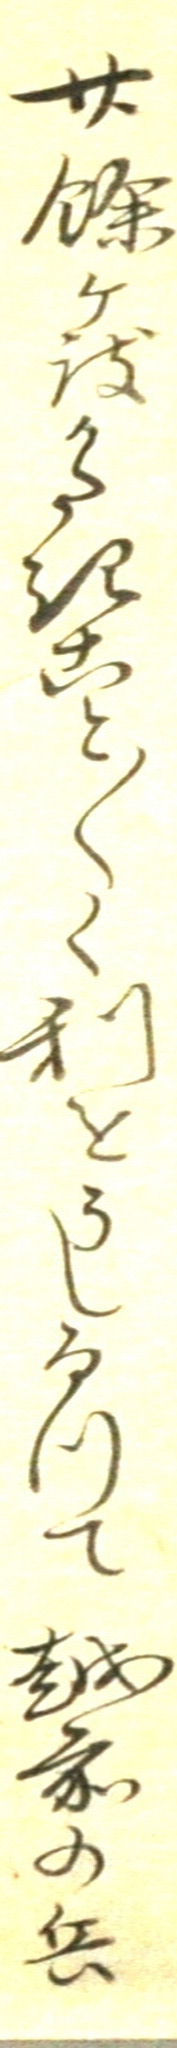廿余ヶ度かたきこと〳〵く利をうしなつて越前の兵
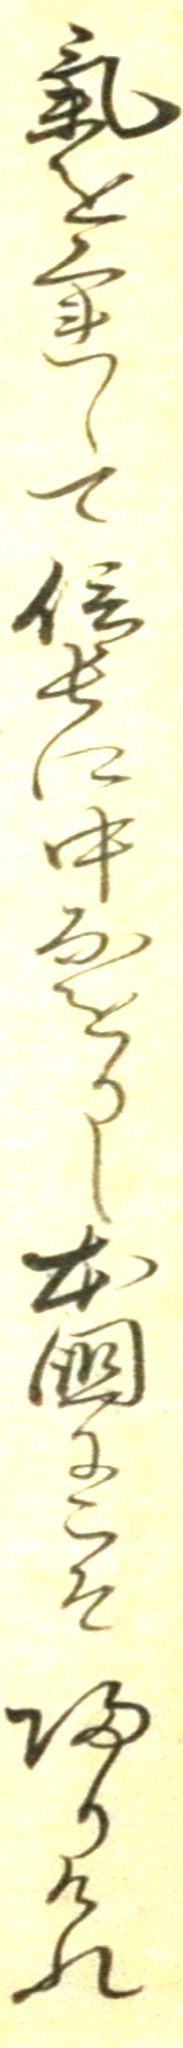気をくれして信長に中なをりし本国にこそ帰りけれ
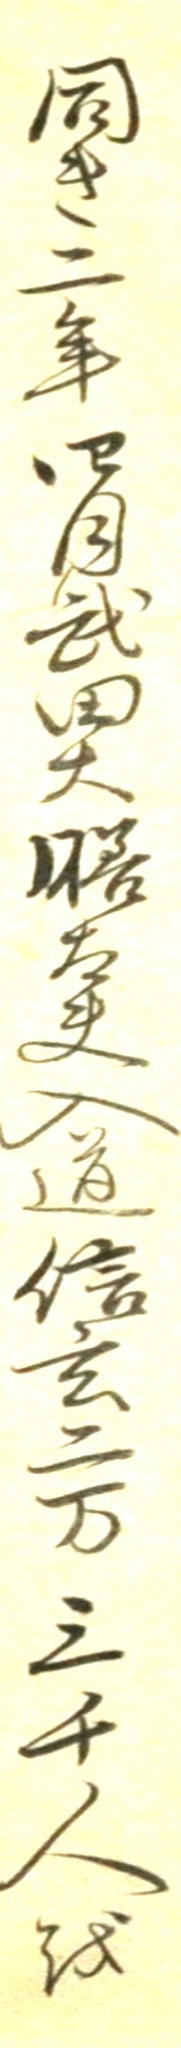同き二年四月武田大膳太夫入道信玄二万三千人を
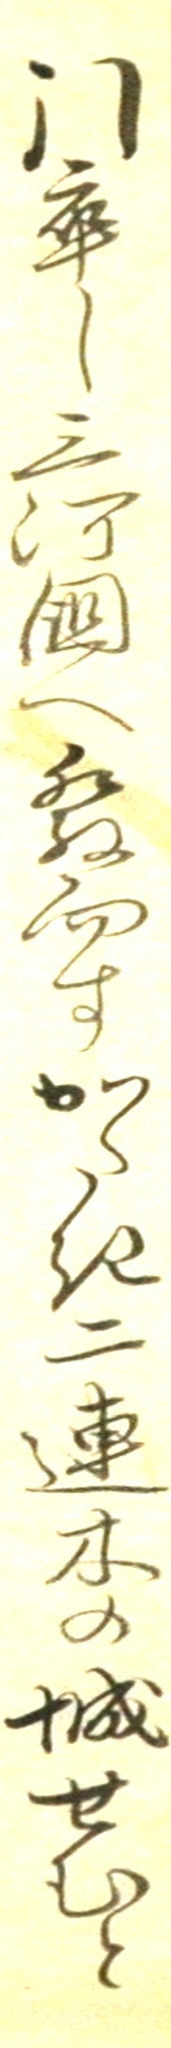引率し三河国へ発向すかたき二連木の城せむと
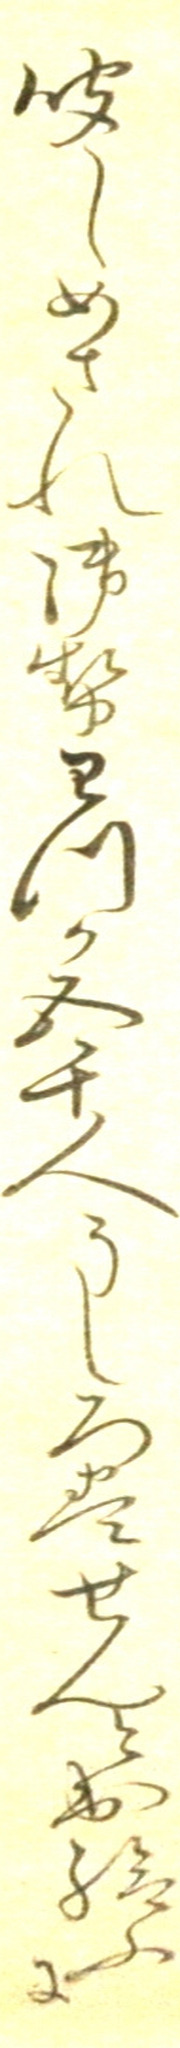聞しめされ御勢わつか五千人うしろ巻せんと出給ふに
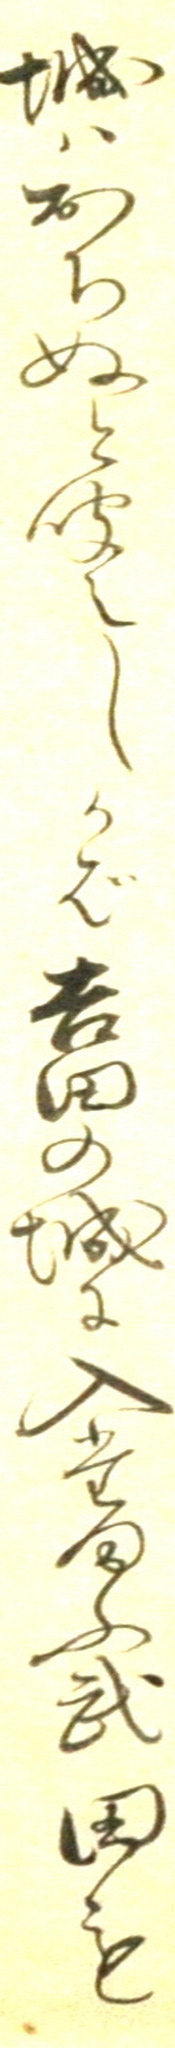し城はおちぬと聞えしかば吉田の城に入たまふ武田も
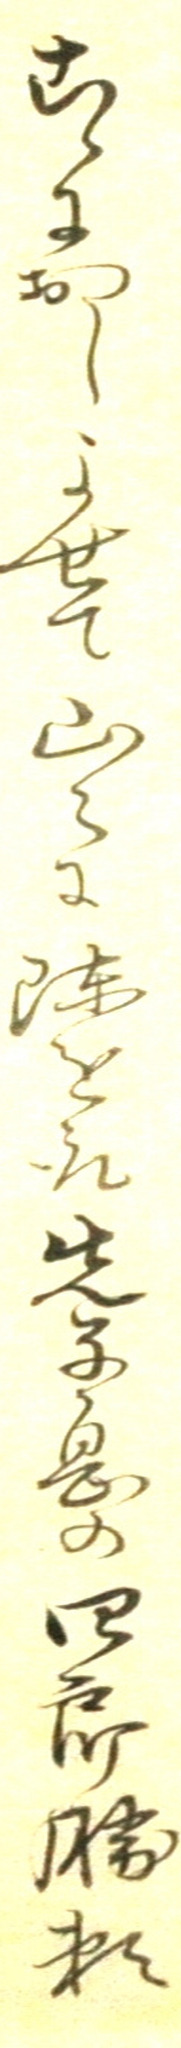こゝにおしよせて山々に陣を取先子息の四郎勝頼
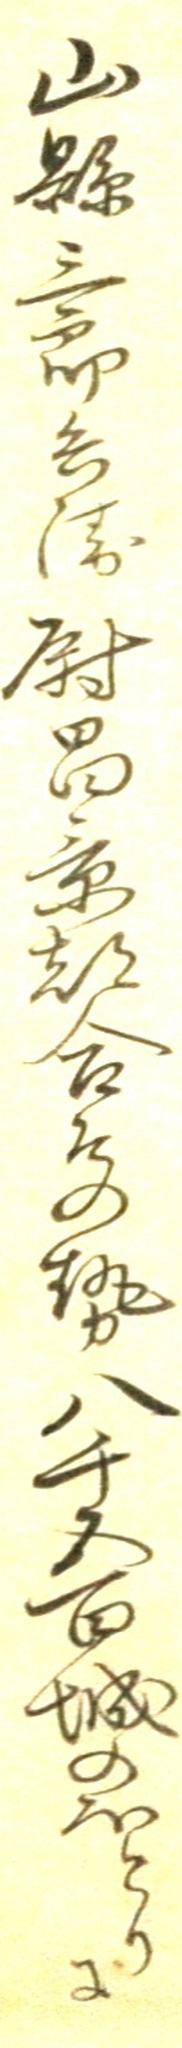山縣三郎兵衛尉昌景都合その勢八千五百城のほとりに
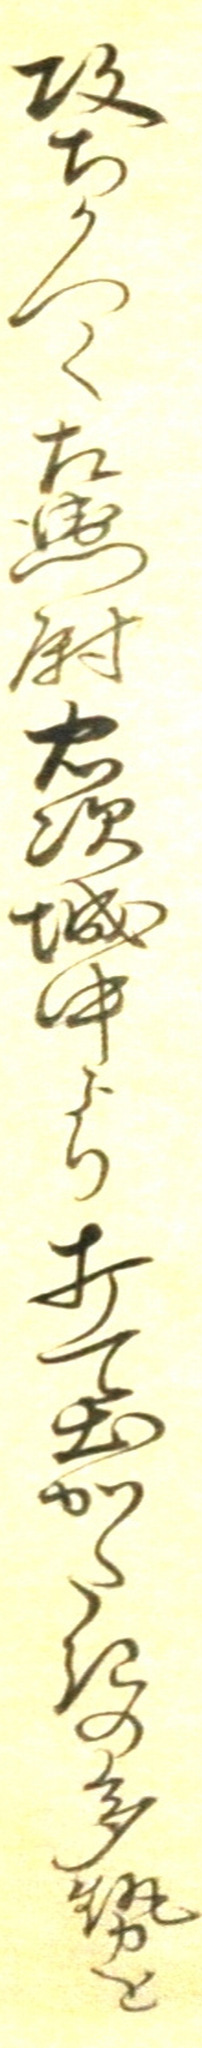攻ちかつく左衛門尉忠次城中より打て出かたきの多勢を
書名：藩翰譜（四・上）
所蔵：伊那市立高遠町図書館・合同会社AMANE
